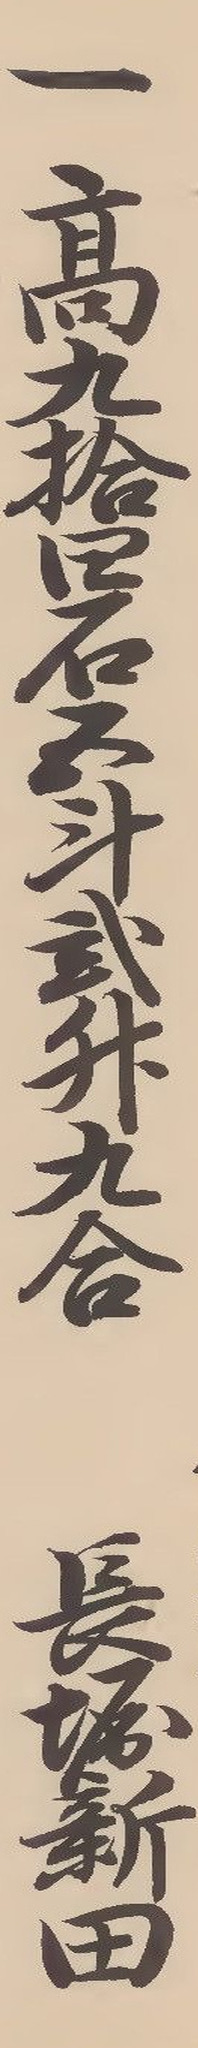一高九拾四石五斗弐升九合長堀新田
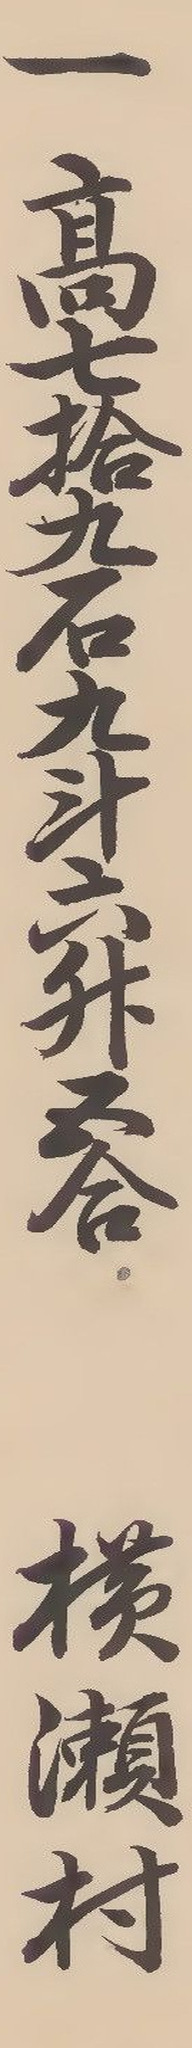一高七拾九石九斗六升五合横瀬村

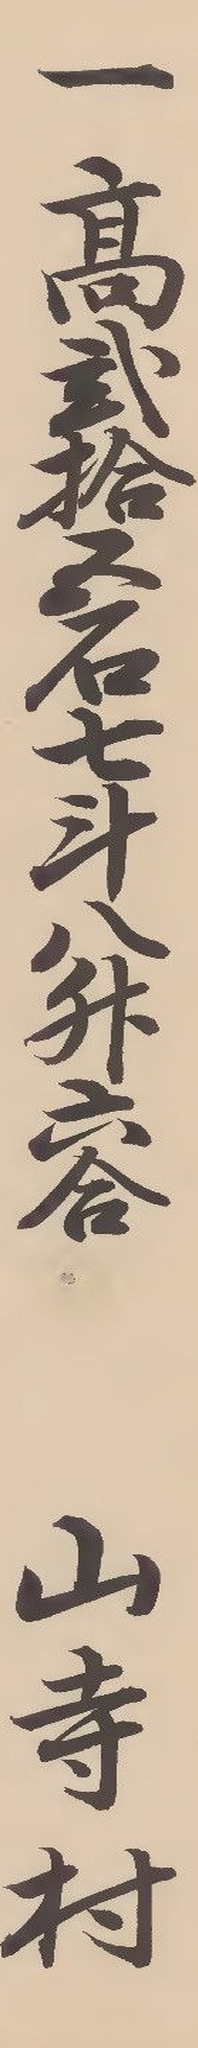一高弐拾五石七斗八升六合山寺村
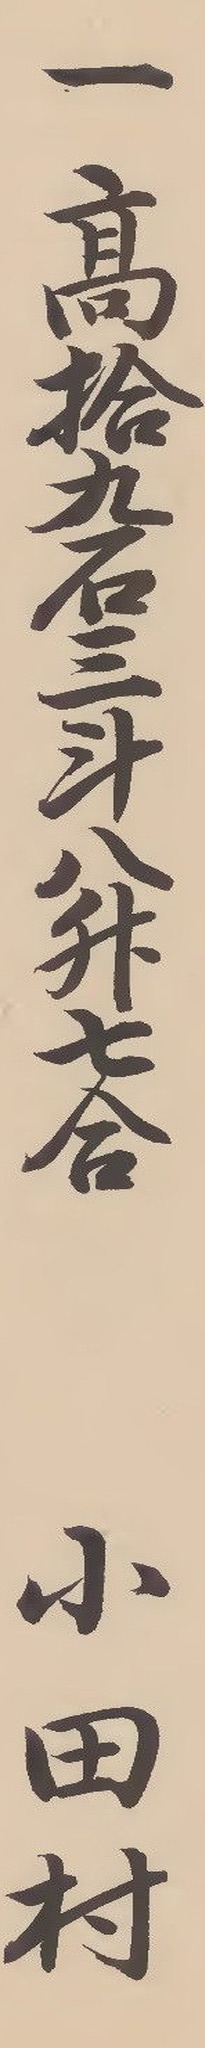一高拾九石三斗八升七合小田村
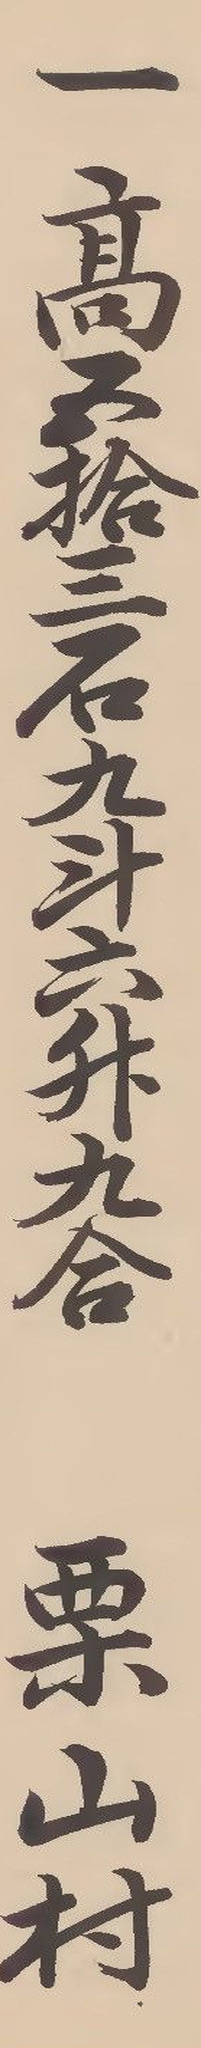一高五拾三石九斗六升九合栗山村
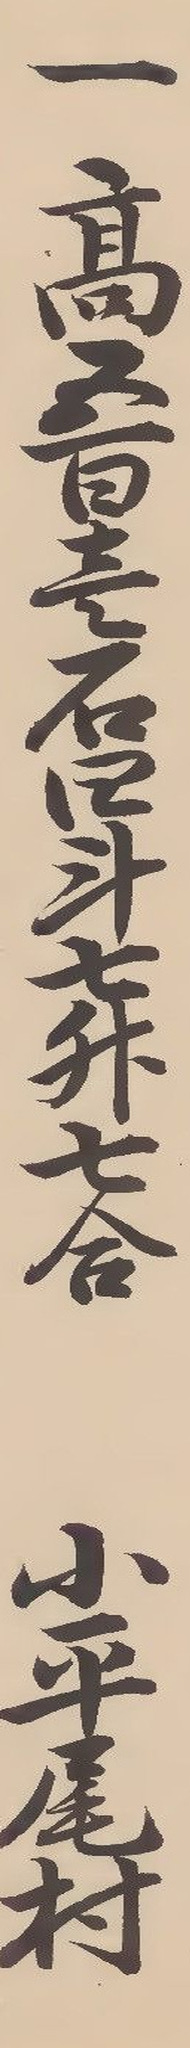一高五百壱石四斗七升七合小平尾村
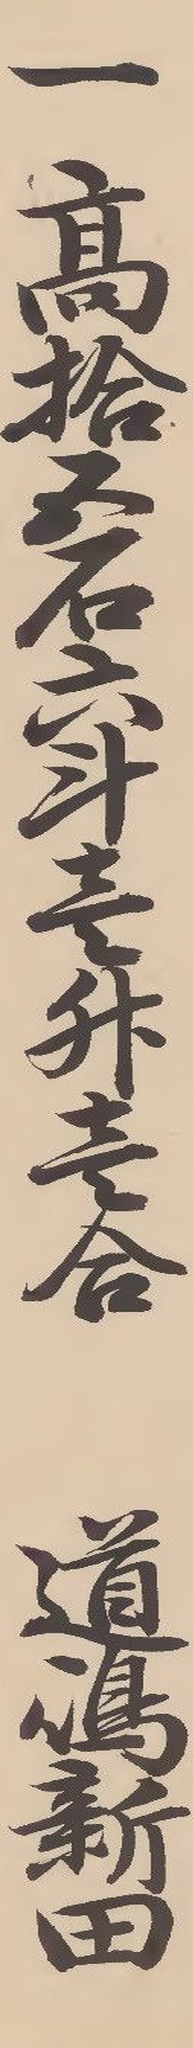一高拾五石六斗壱升壱合道島新田
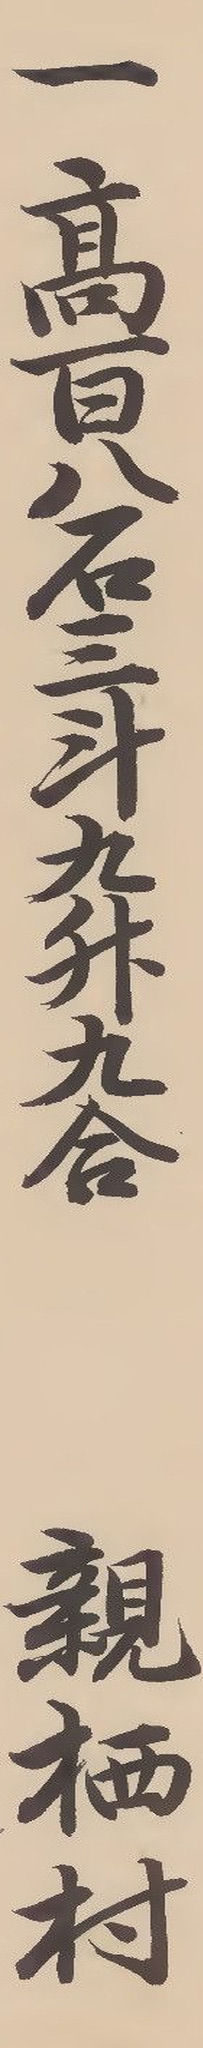一高百八石三斗九升九合親栖村
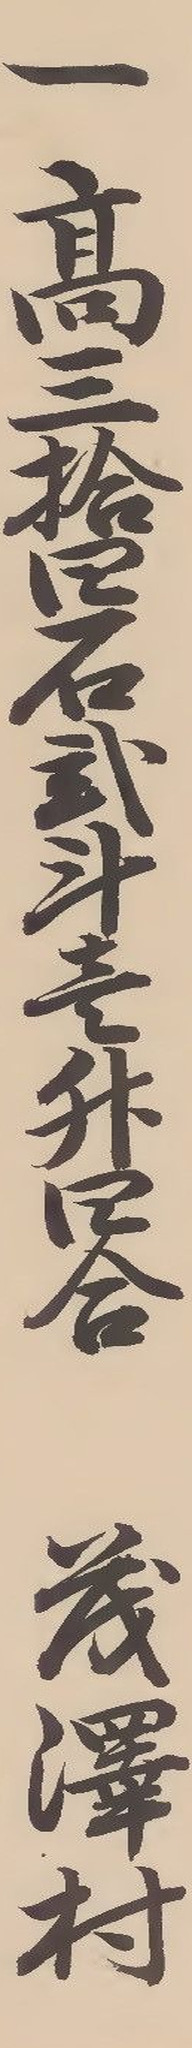一高三拾四石弐斗壱升四合茂沢村
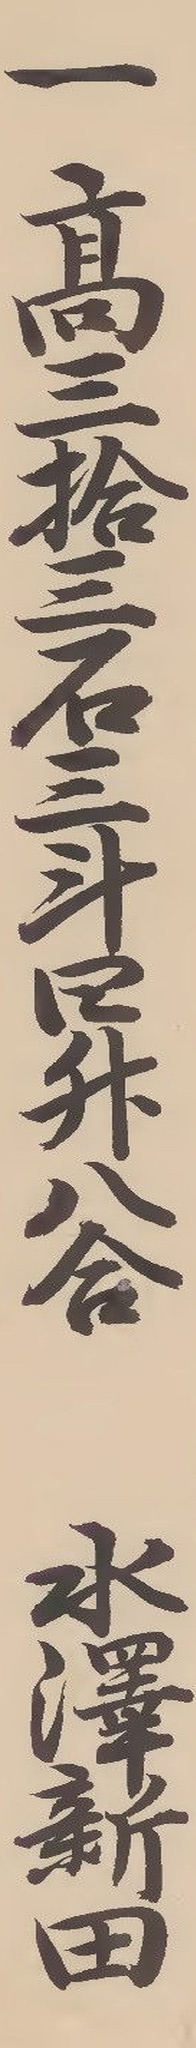一高三拾三石三斗四升八合水沢新田

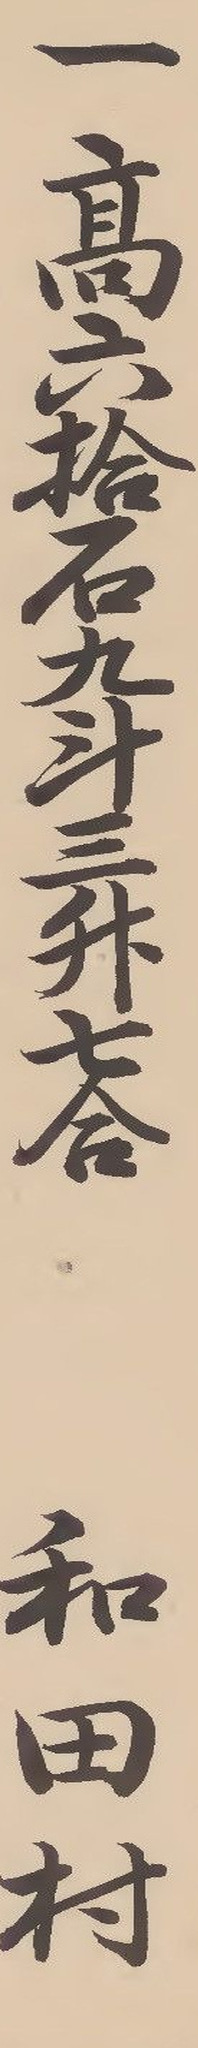一高六拾石九斗三升七合和田村
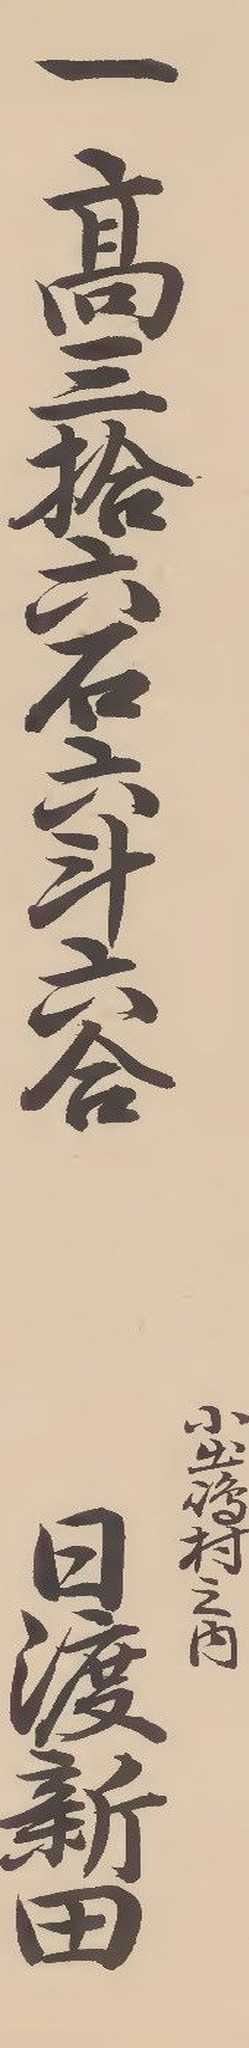一高三拾六石六斗六合日渡新田
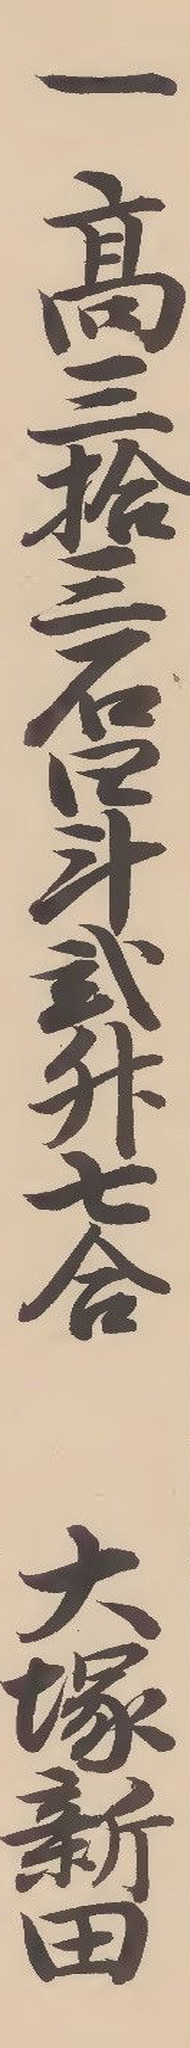一高三拾三石四斗弐升七合大塚新田
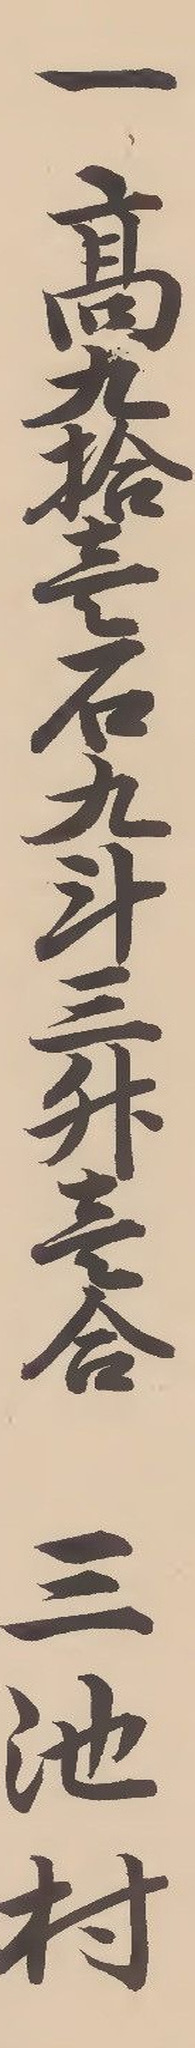一高九拾壱石九斗三升壱合三池村
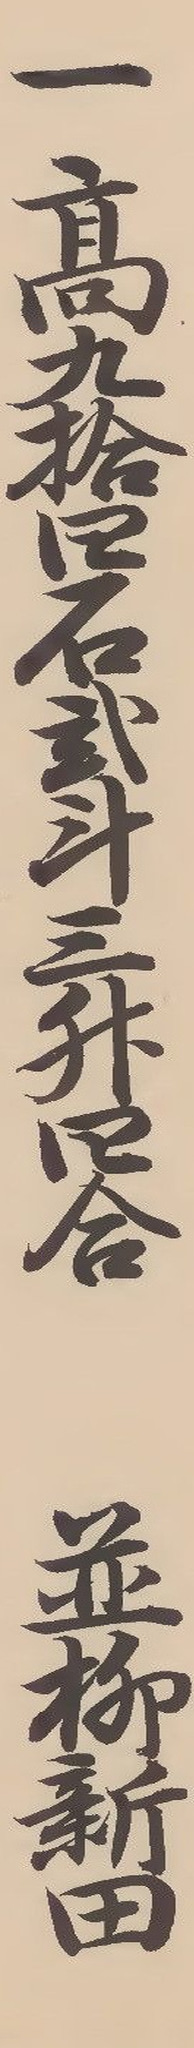一高九拾四石弐斗三升四合並柳新田
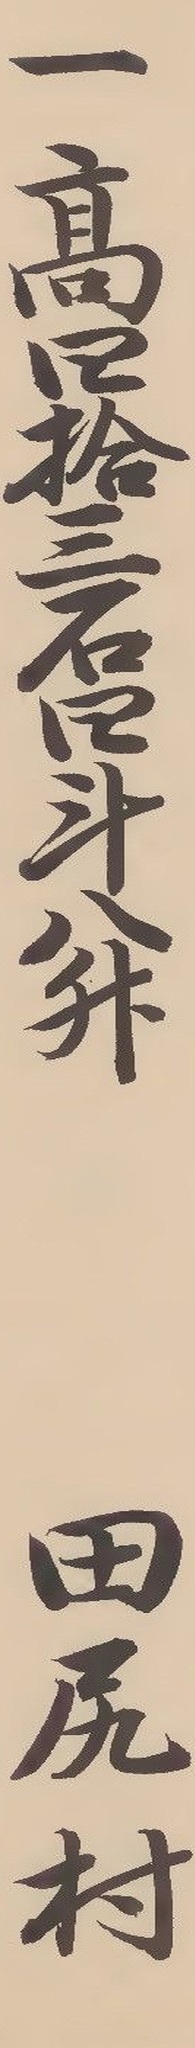一高四拾三石四斗八升田尻村
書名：越後国郷帳　中
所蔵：国立公文書館 National Archives of Japan
